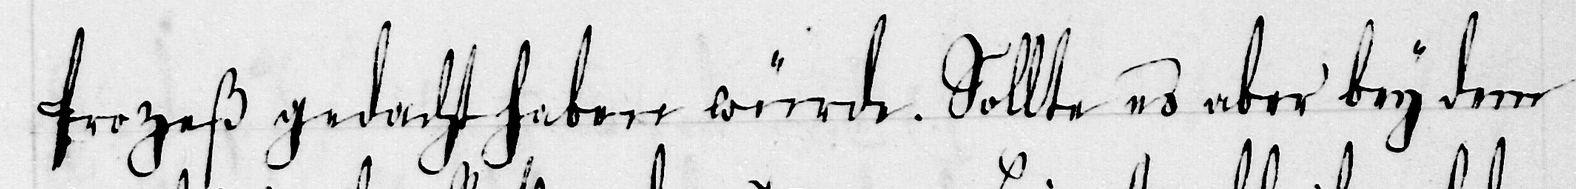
Prozeß gedacht haben würde. Sollte es aber bey dem
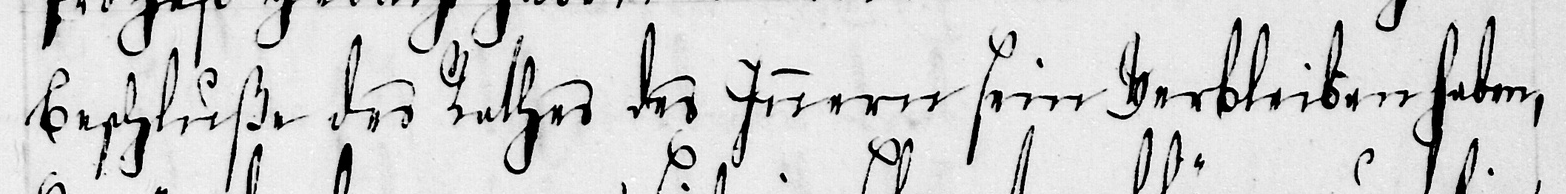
Beschluße des Rathes des Innern sein Verbleiben haben,
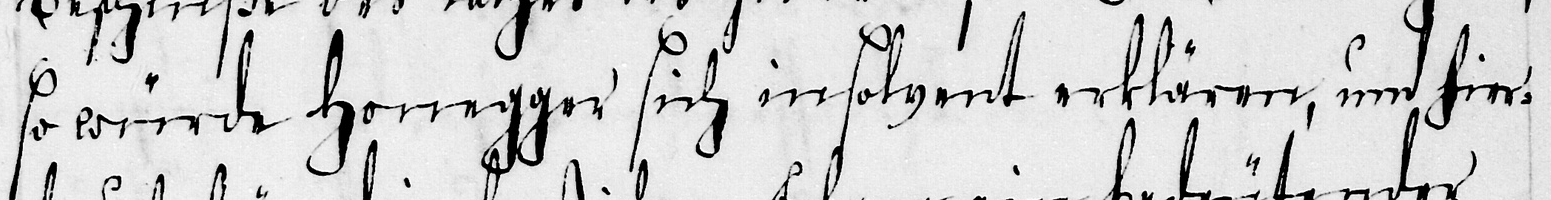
so würde Honegger sich insolvent erklären, und hier¬
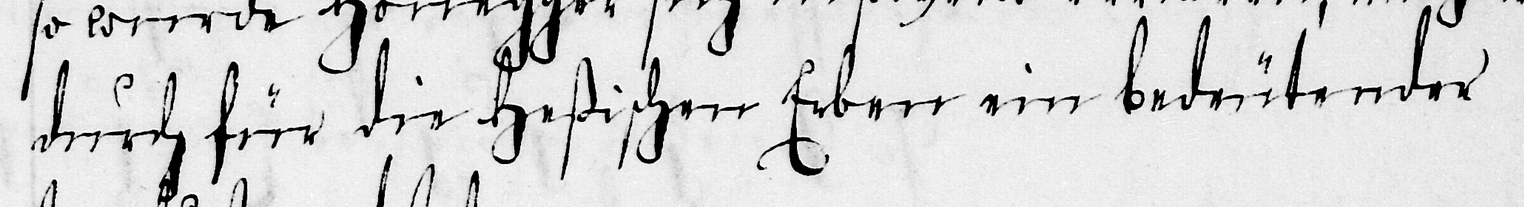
durch für die Heßischen Erben ein bedeutender
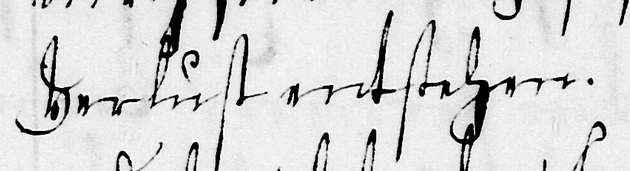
Verlust entstehen.
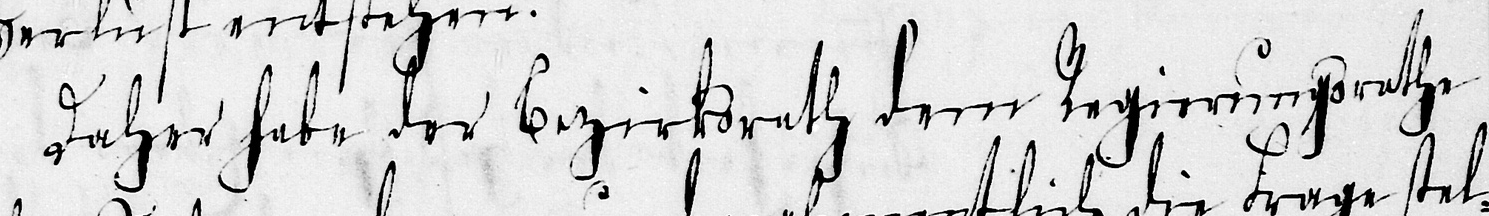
Daher habe der Bezirksrath dem Regierungsrathe
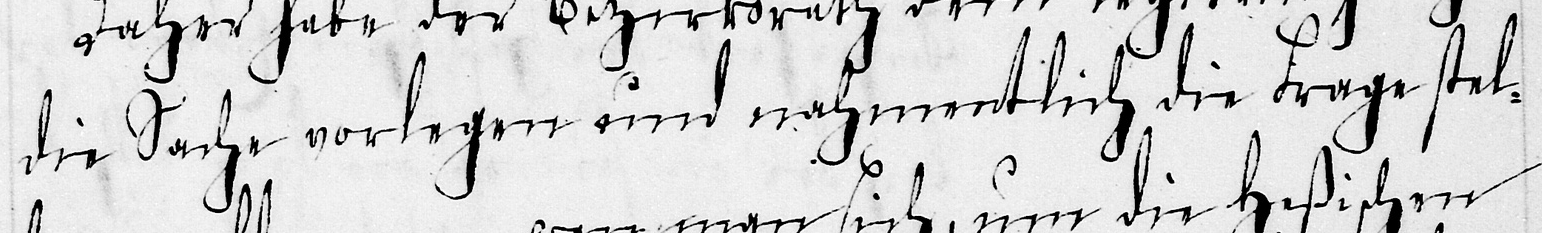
die Sache vorlegen und nahmentlich die Frage stel¬
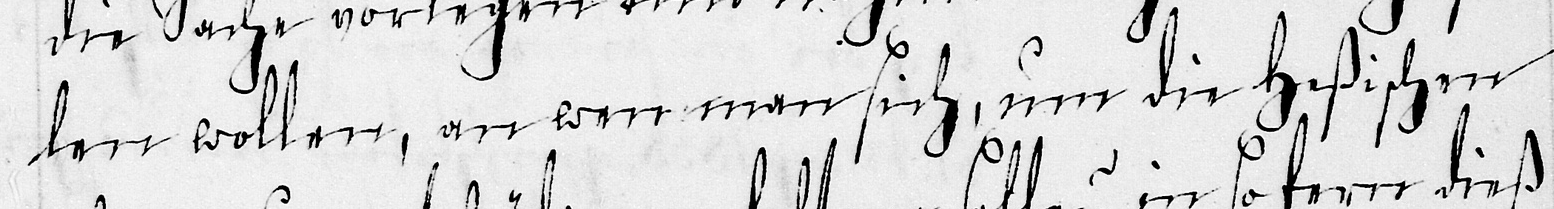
len wollen, an wen man sich, um die Heßischen
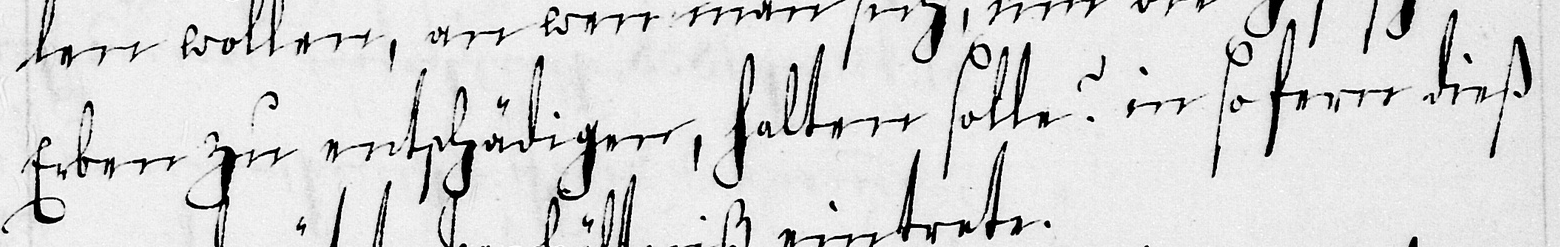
Erben zu entschädigen, halten solle? in sofern dieß
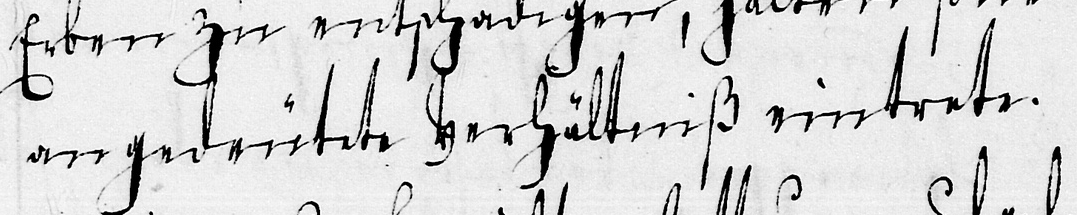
angedeutete Verhältniß eintrete.
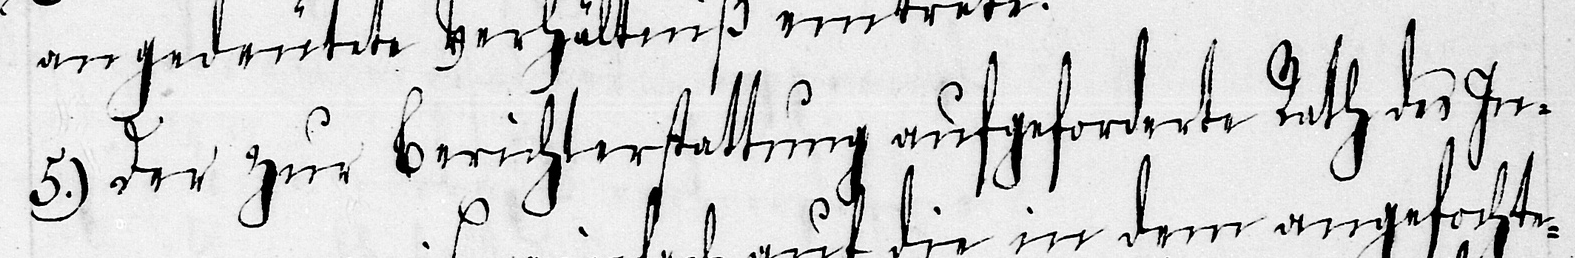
5.) Der zur Berichterstattung aufgeforderte Rath des In¬
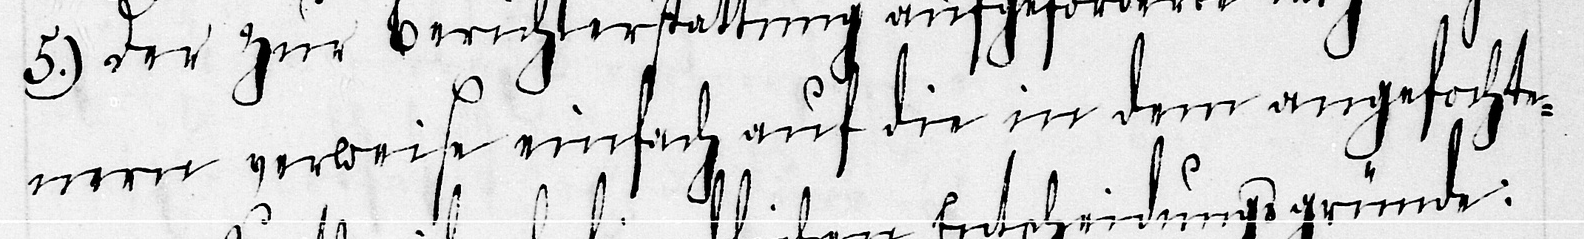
nern verweise einfach auf die in dem angefochte¬
